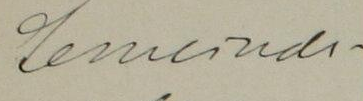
Gemeinde
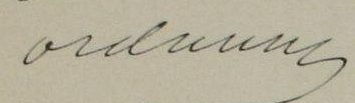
ordnung
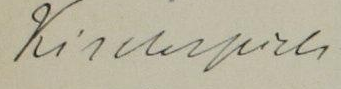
Kirchspiels
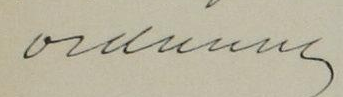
ordnung
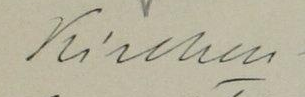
Kirchen
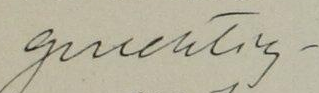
gerechtig
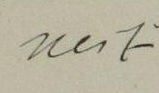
keit
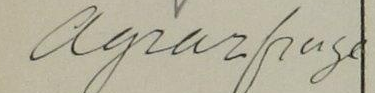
Agrarfrage
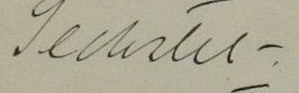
Sechstel-
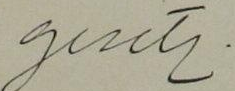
gesetz
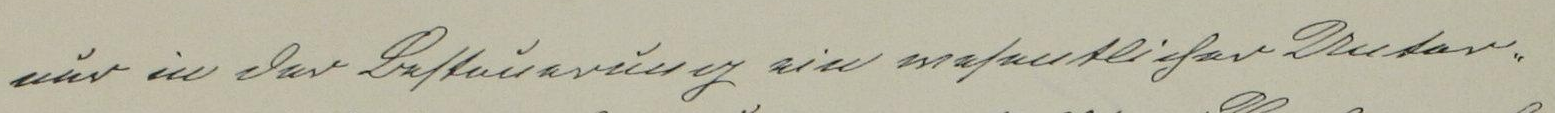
nur in der Besteuerung ein wesentlicher Unter-
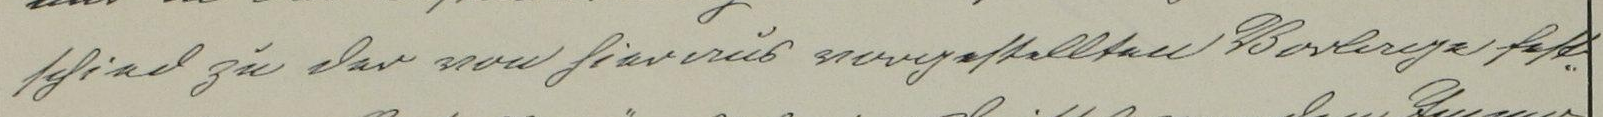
schied zu der von hieraus vorgestellten Vorlage fest-
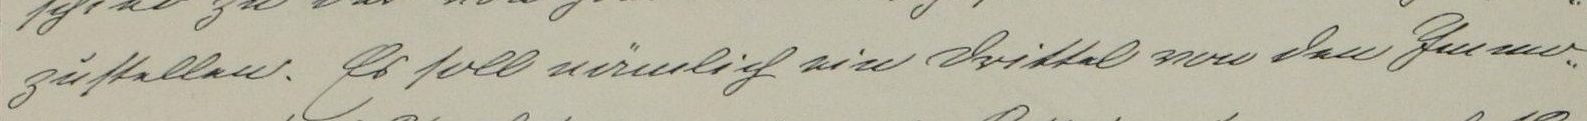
zustellen. Es soll nämlich ein Drittel von den Immo-
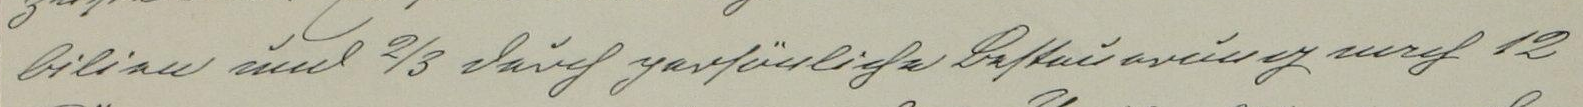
bilien und ⅔ durch persönliche Besteuerung nach 12
